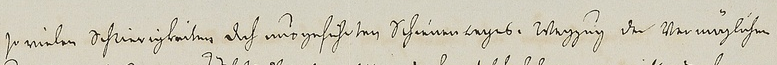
so vielen Schwierigkeiten doch ausgeführten Schienenweges. Wegzug der Vermöglichen
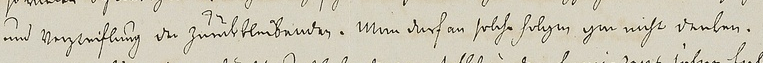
und Verzweiflung der Zurückbleibenden. Man darf an solche Folgen gar nicht denken.
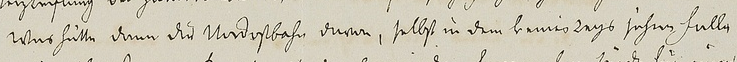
Was hätte dann die Nordostbahn davon, selbst in dem keineswegs sichern Falle
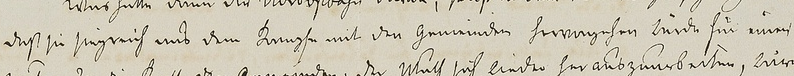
daß sie siegreich aus dem Kampfe mit den Gemeinden hervorgehen würde für einen
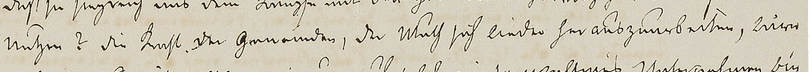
Nutzen? Die Kraft der Gemeinden, der Muth sich wieder herauszuarbeiten, wäre
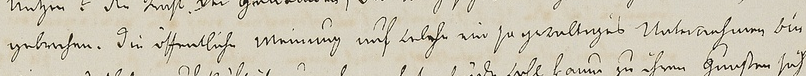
gebrochen. Die öffentliche Meinung auf welche ein so gewaltiges Unternehmen wie
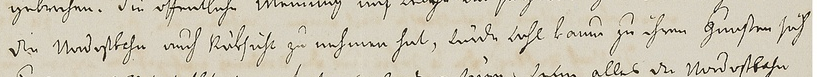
die Nordostbahn auch Rüksicht zu nehmen hat, würde wohl kaum zu ihren Gunsten sich
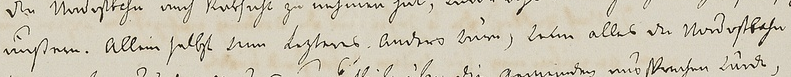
äußern. Allein selbst wenn Lezteres anders wäre, wenn alles der Nordostbahn
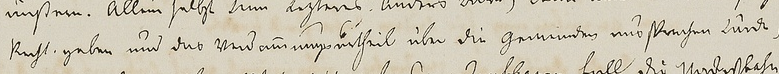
Recht geben und das Verdammungsurtheil über die Gemeinden aussprechen würde,
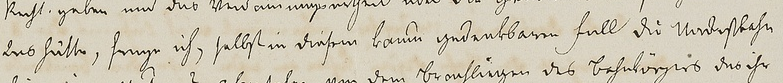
was hätte, frage ich, selbst in diesem kaum gedenkbaren Fall die Nordostbahn
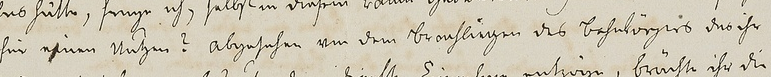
für einen Nutzen? Abgesehen von dem Brachliegen des Bahnkörpers das ihr
